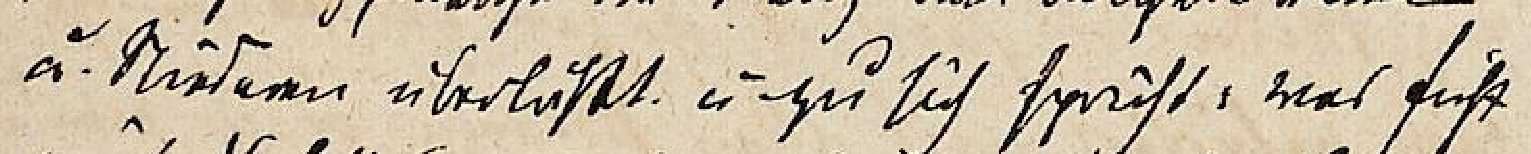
u. Niederen überläßt u. zu sich spricht: was führt
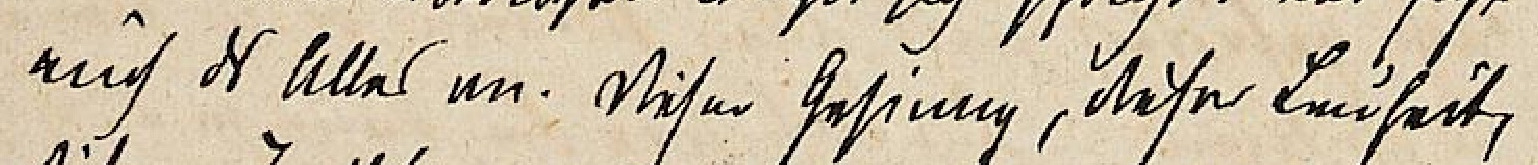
auch ds All an. dieser Gesinng, dieser Lauheit,
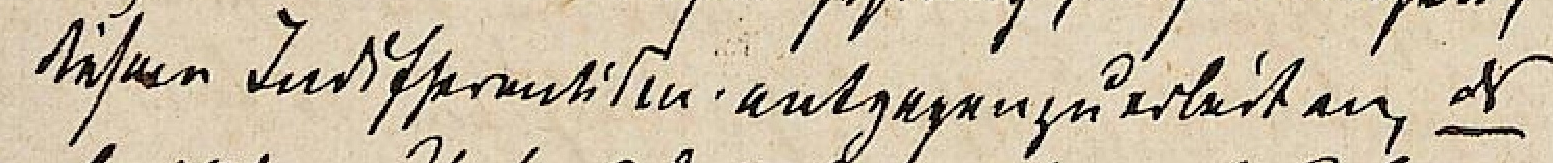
dieser Indifferentism. entgegenzuarbeiten, ds
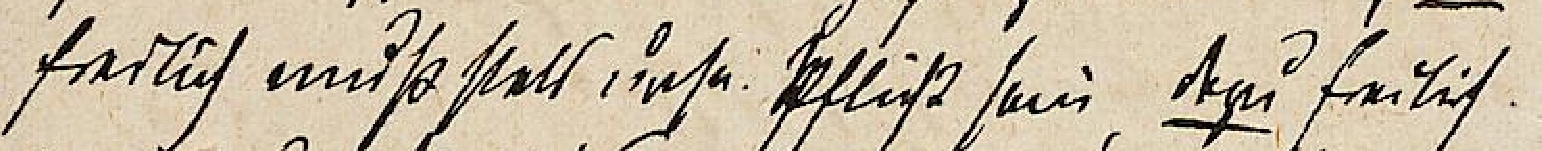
freilich muß stets unsr. Pflicht sein, dazu freilich
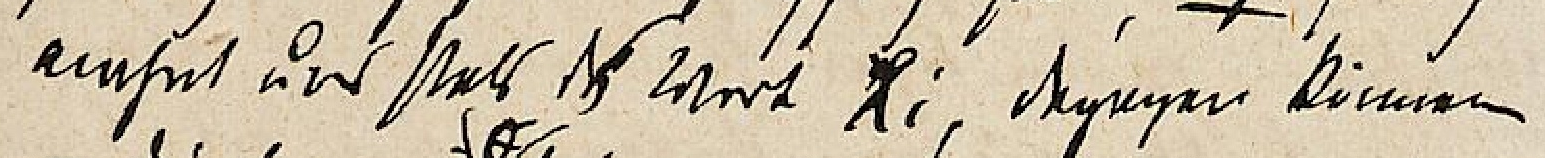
mahnt uns stets ds Wort Χι, dagegen können
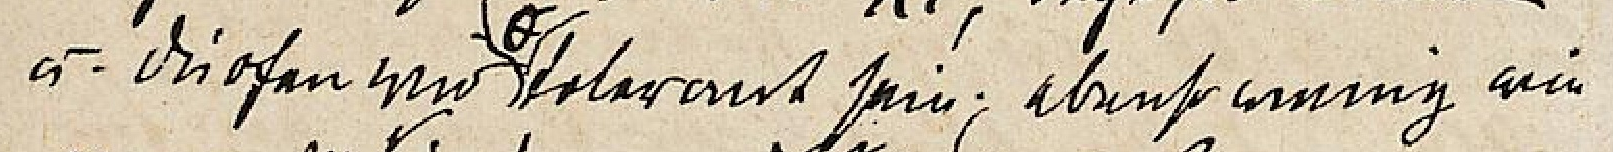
u. dürfen wir o tolerant sein; ebensowenig wie
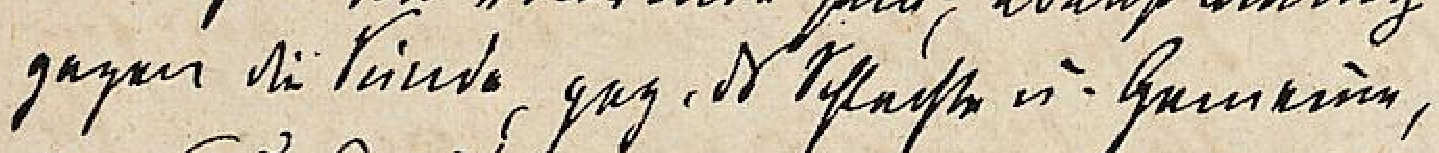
gegen die Sünde, geg. ds Schlechte u Gemeine,
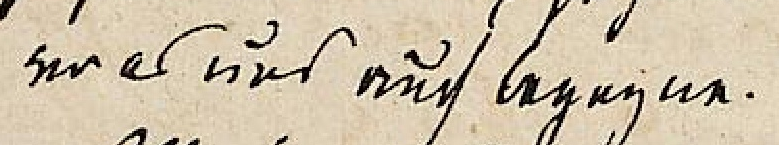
wo es uns auch begegne.
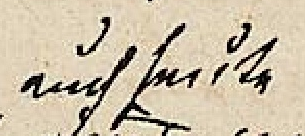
auch heute
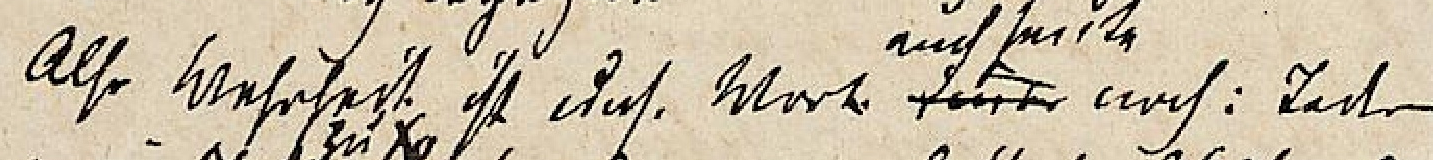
Also Wahrheit ist uns. Wort unter noch: Jeder
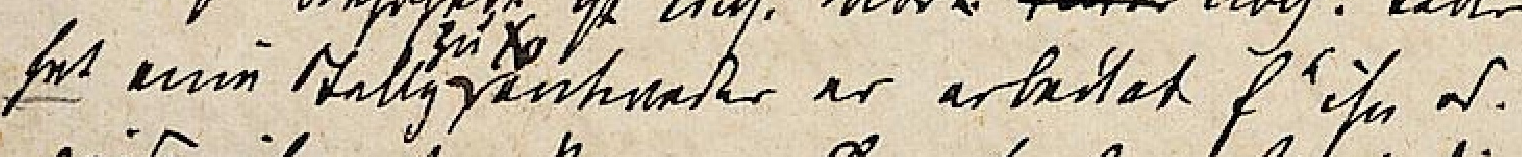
hat eine Stellg Χo, entweder er arbeitet fü ihn od.
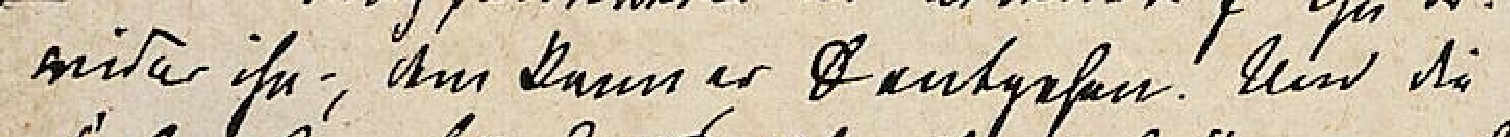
wider ihn; dem kann er o entgehen. Und die
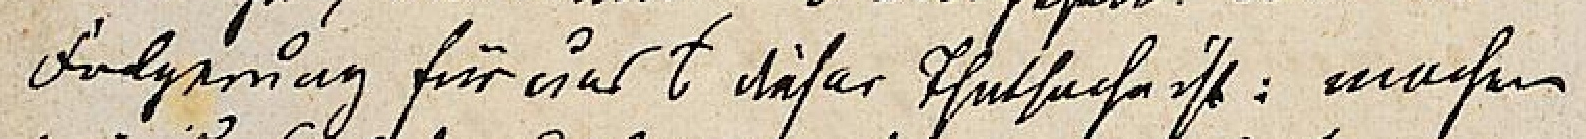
Folgerung für uns s dieser Thatsache ist: machen
